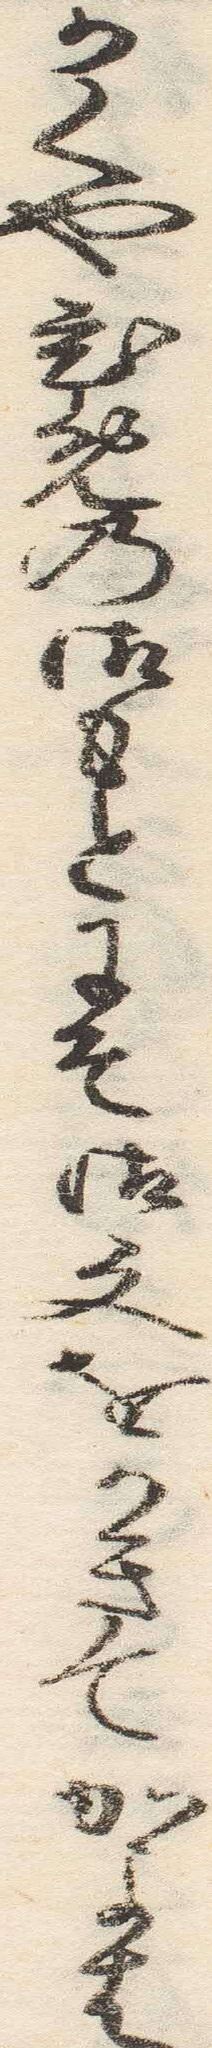かくやひめの御もとにそ御文をかきてかよは
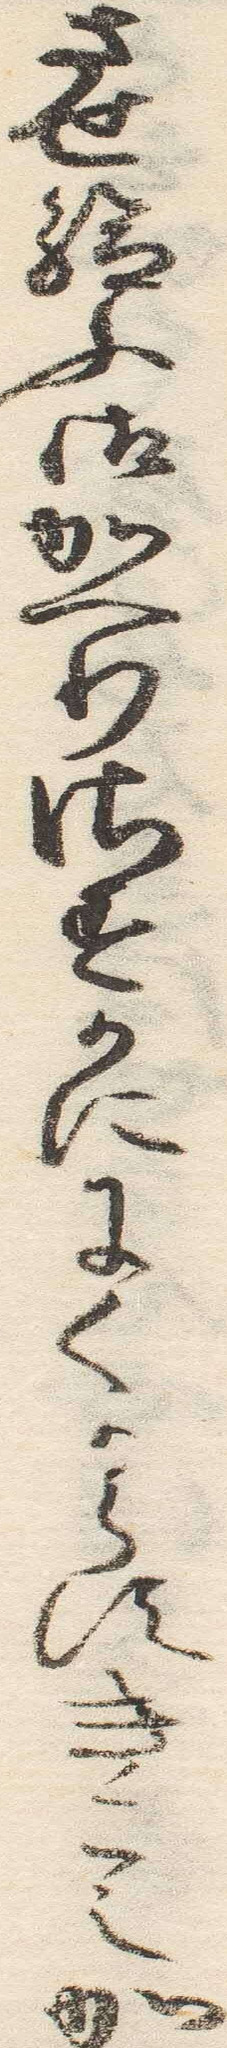させ給ふ御かへりさすかににくからすきこえか
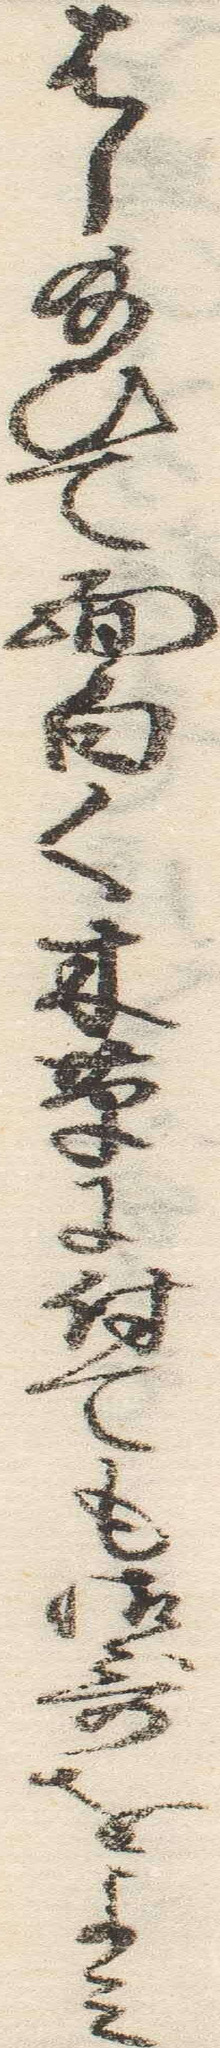はした給ひて面白く木草に付けても御歌をよみ
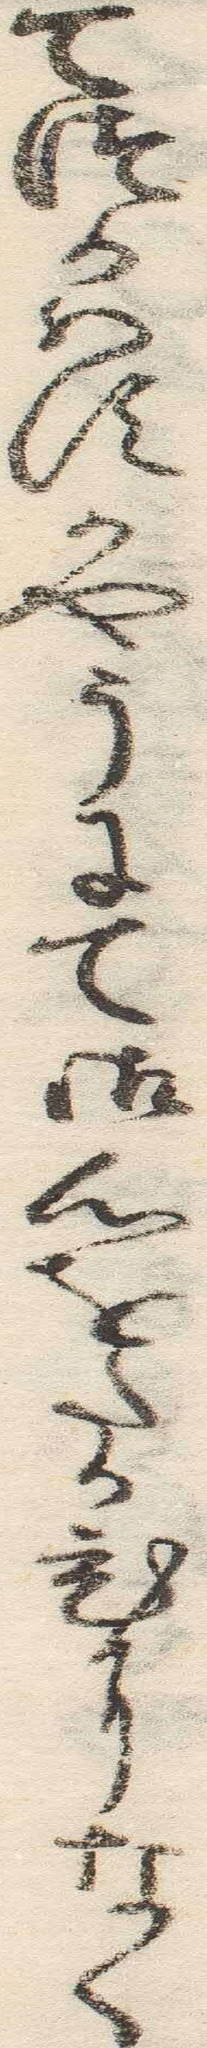てつかはすかやうにて御心をたかひになく
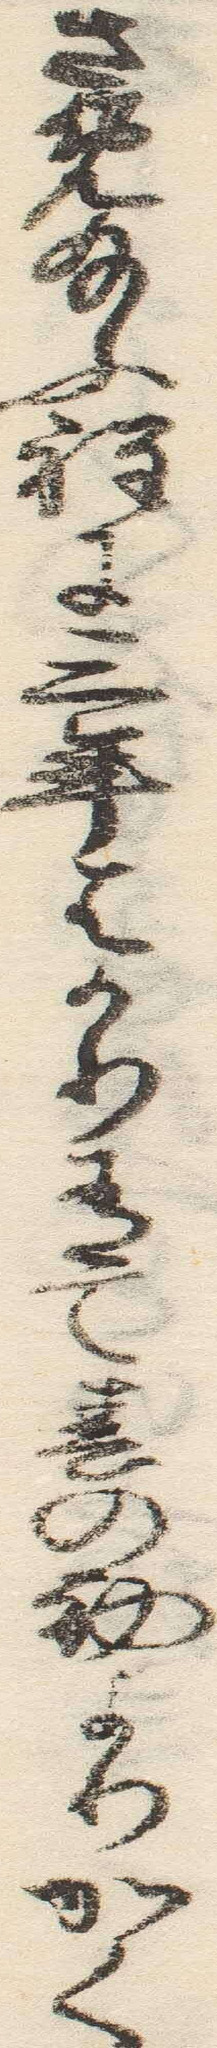さめ給ふ程に三年はかり有て春の初よりかく
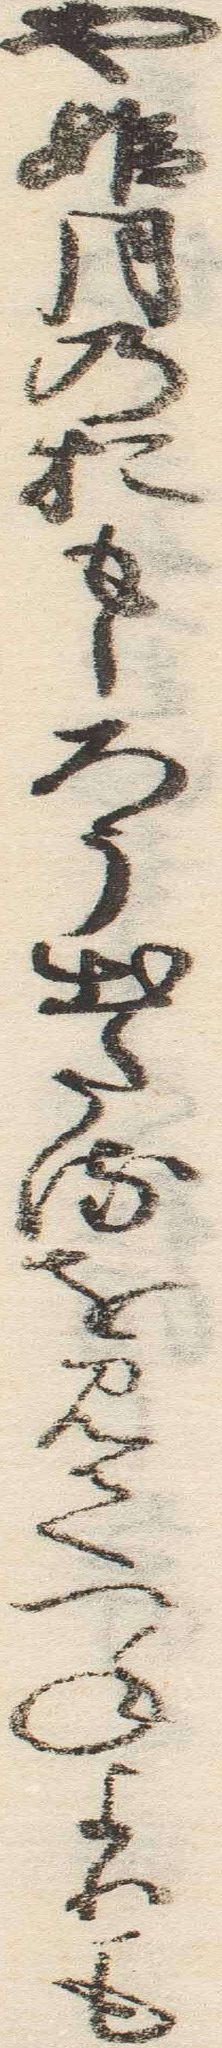や姫月のおもしろう出たるを見てつねよりも
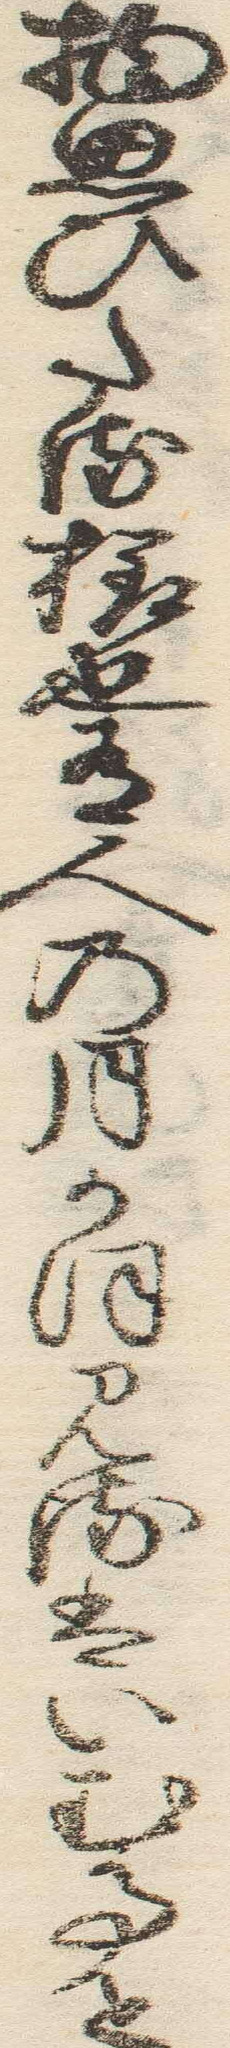物思ひたる様也有人の月かほ見るはいむ事と
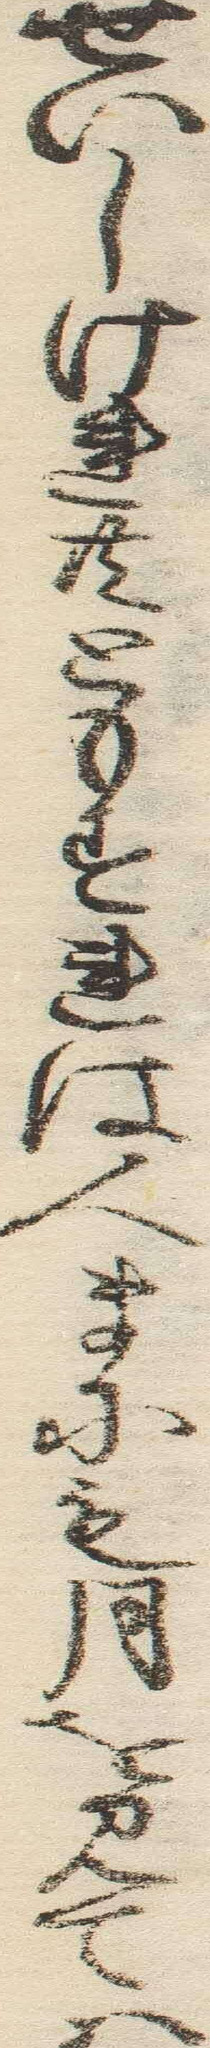せいしけれ共ともすれは人まにも月を見ては
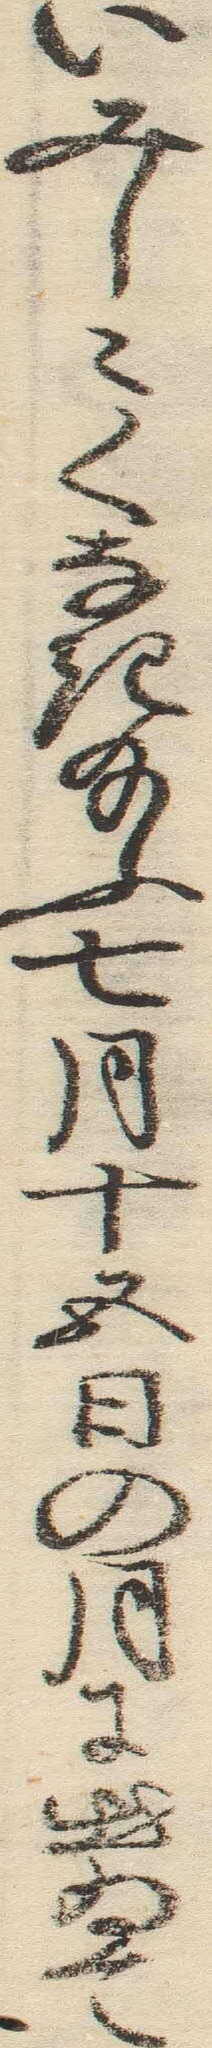いみしけくなき給ふ七月十五日の月に出ゐて

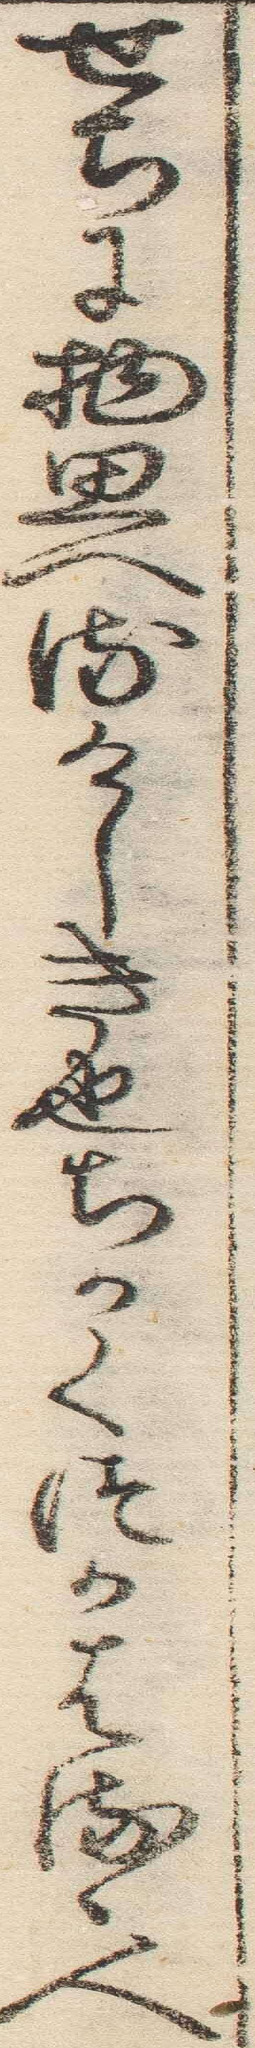せちに物思へるけしき也ちかくつかはるゝ人
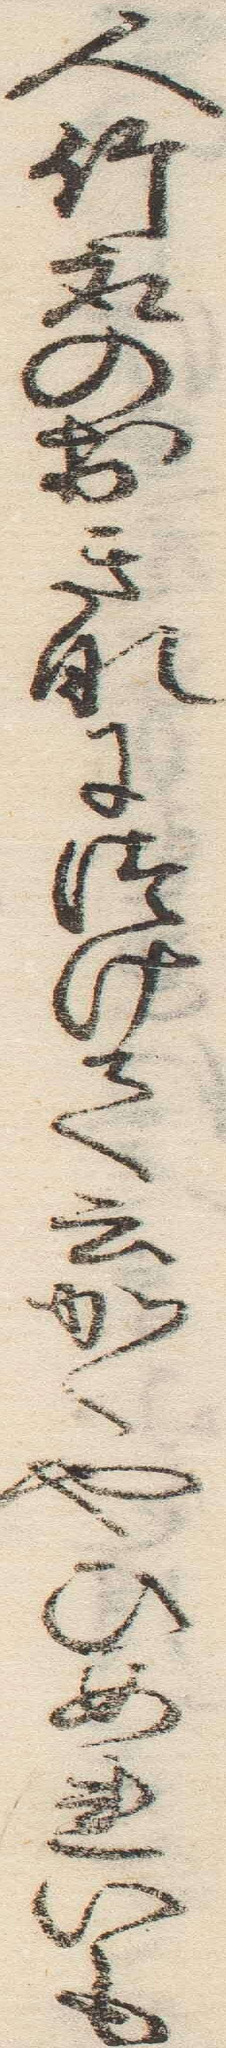人竹取のおきなにつけて云かくやひめれいも
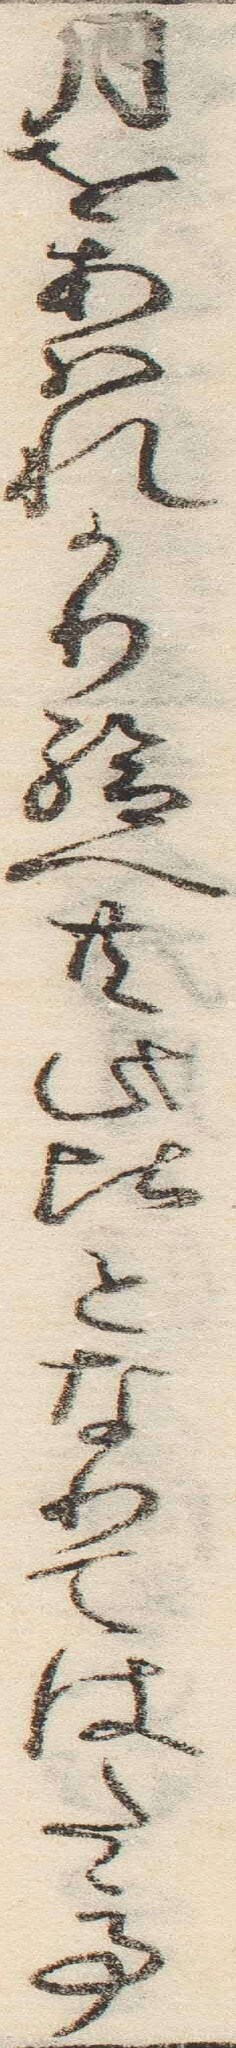月をあはれかり給へ共此頃となりてはたゝ事
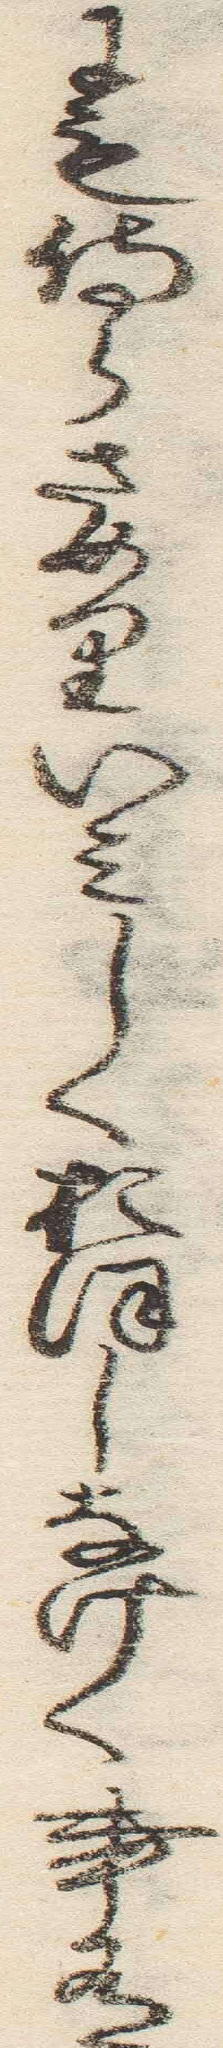にも侍らさめりいみしくおほしなけく事有
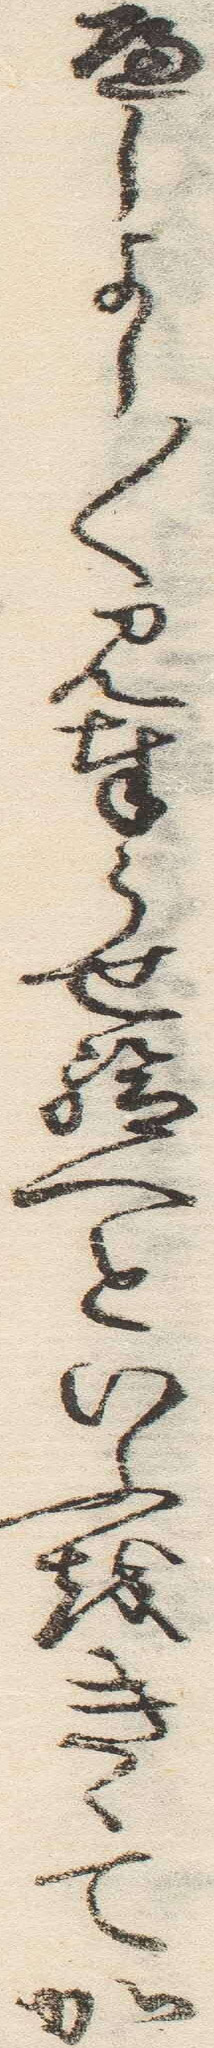へしよく〳〵身奉らせ給へといふをきゝてか
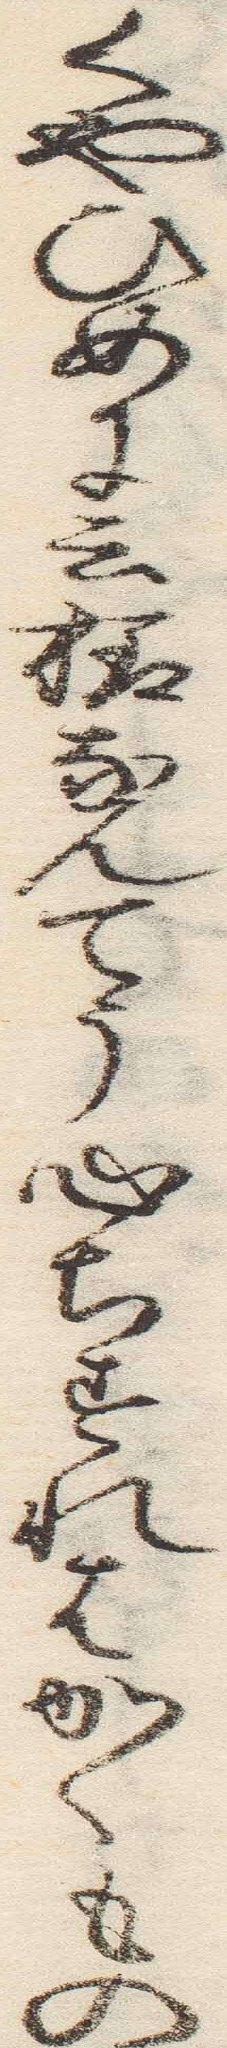くやひめに云様なんてう心ちすれはかくもの
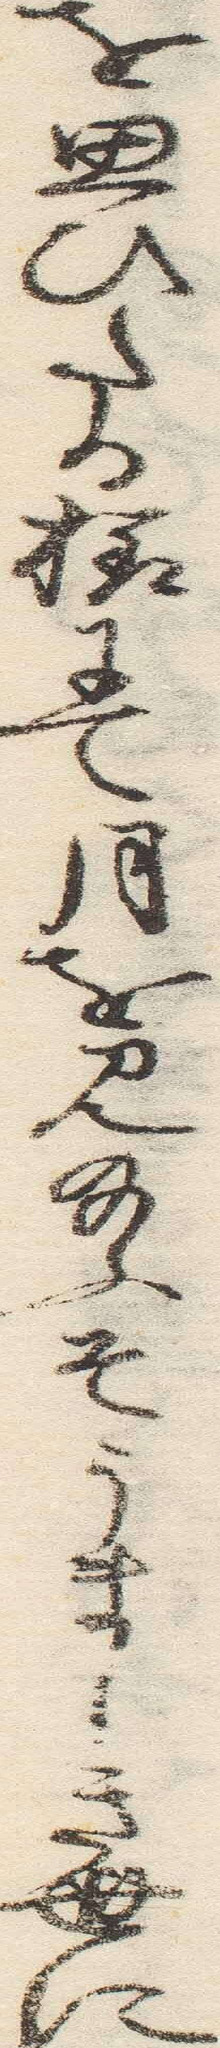を思とひたる様にて月を見給ふそうましき世に
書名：竹取物語
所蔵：東京学芸大学附属図書館 国文学研究資料館
